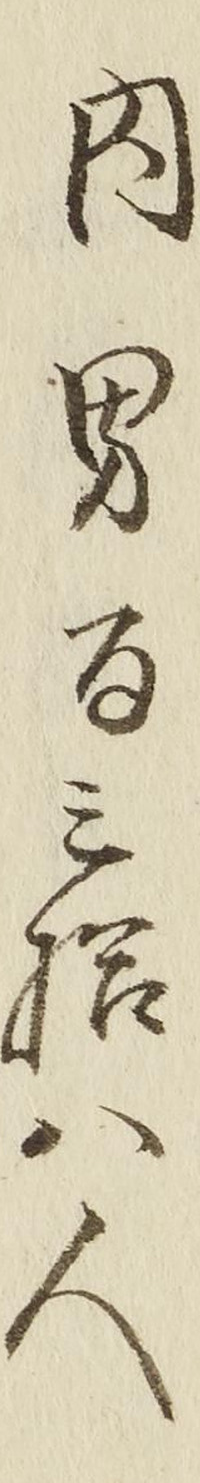内男百三拾八人
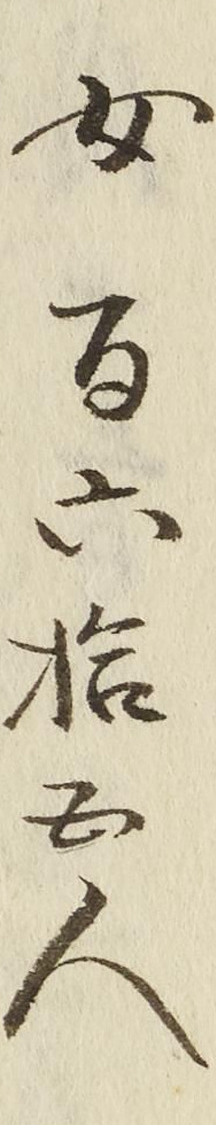女百六拾五人
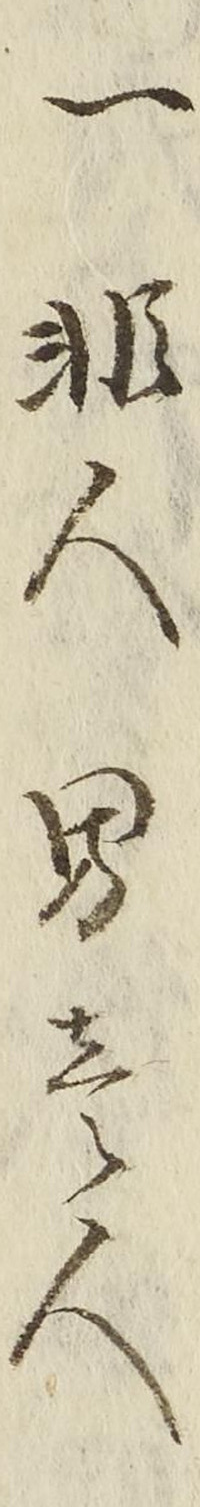一非人男壱人

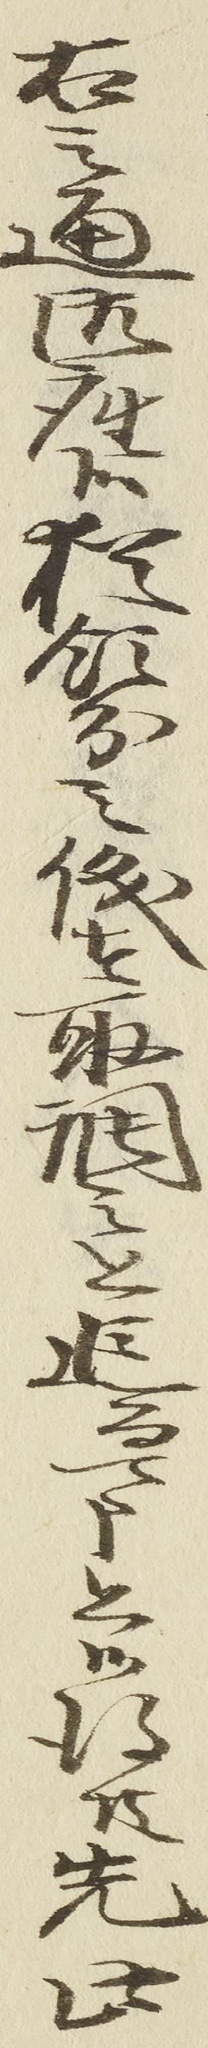右之通御座候猶余分之儀は取調之上追而可申上候得共先此
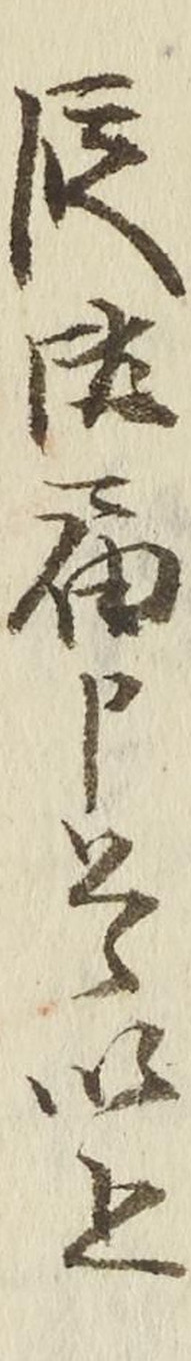段御届申上候以上
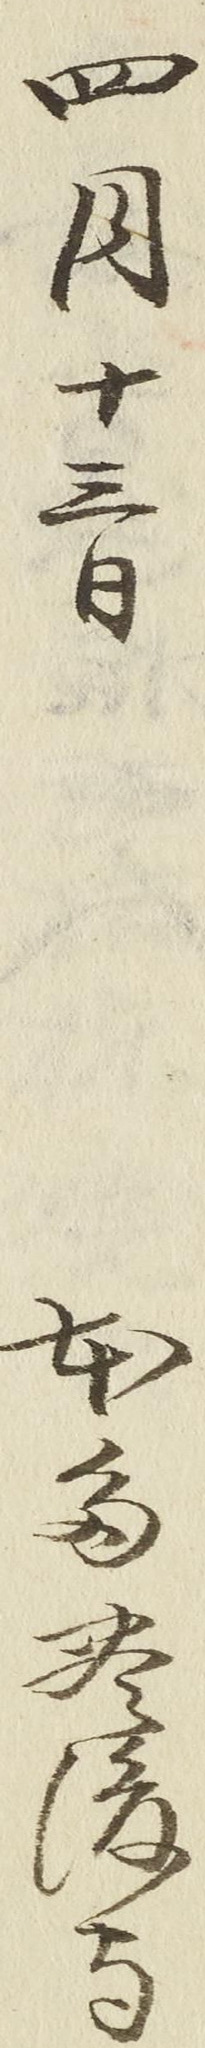四月十三日本多豊後守
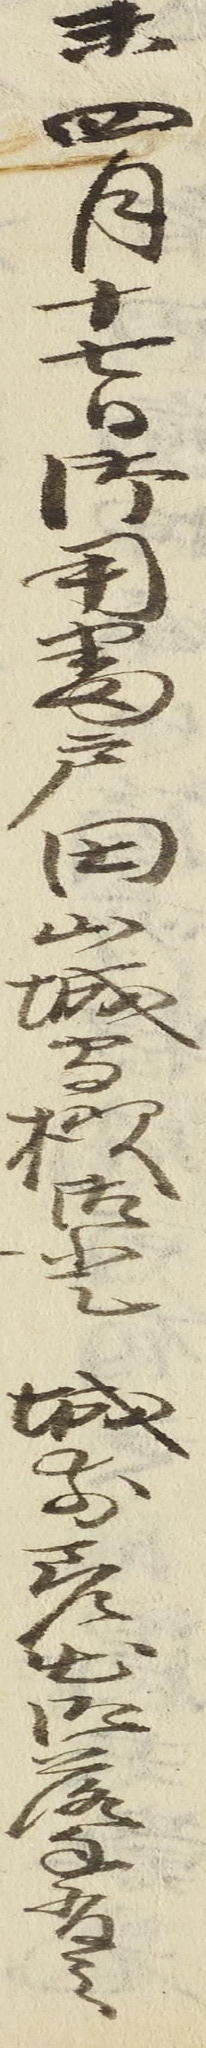未四月十七日御用番戸田山城守様御登城前差出御落手有之
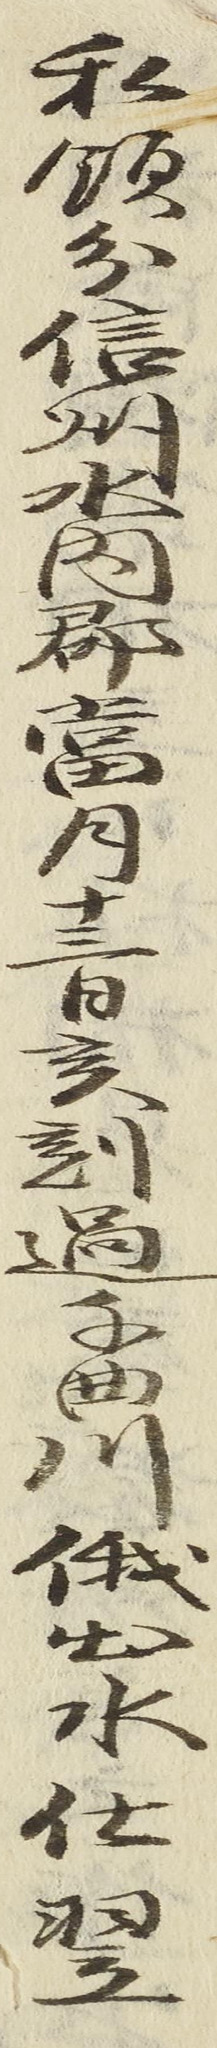私領分信州水内郡当月十三日亥刻過千曲川俄出水仕翌
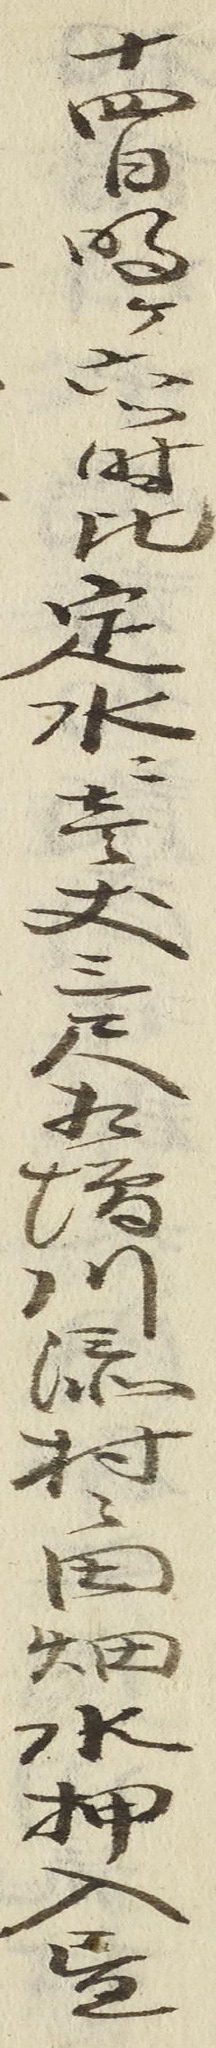十四日明ヶ六ッ時比定水二壱丈三尺相増川添村々田畑水押入昼
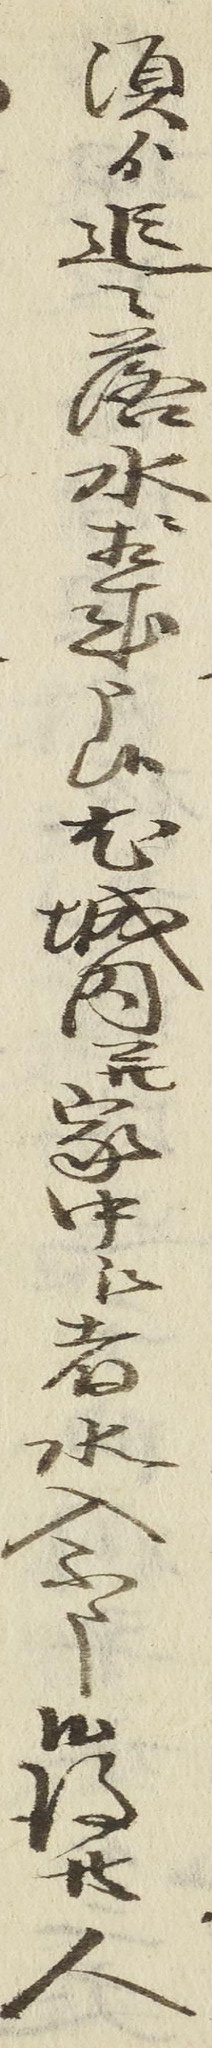頃ゟ追々落水二相成申候尤城内并家中江は水入不申候得共人
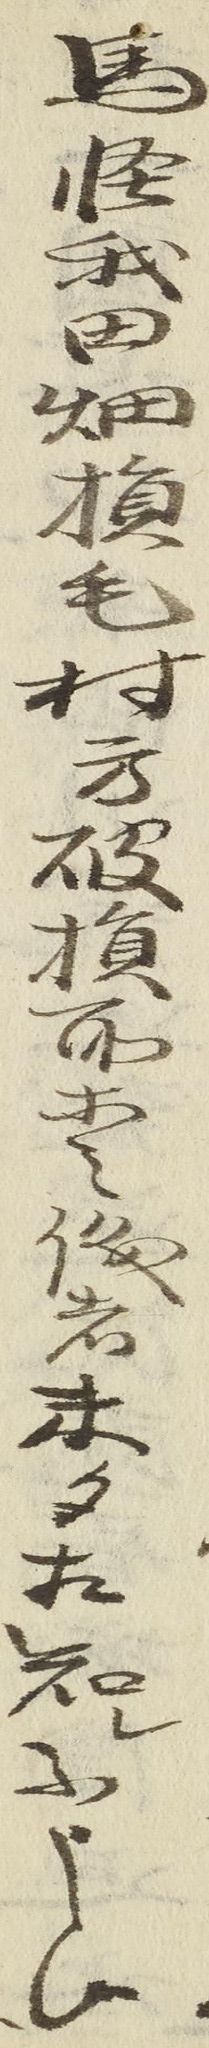馬怪我田畑損毛村方破損所之儀は未タ相知ㇾ不申候
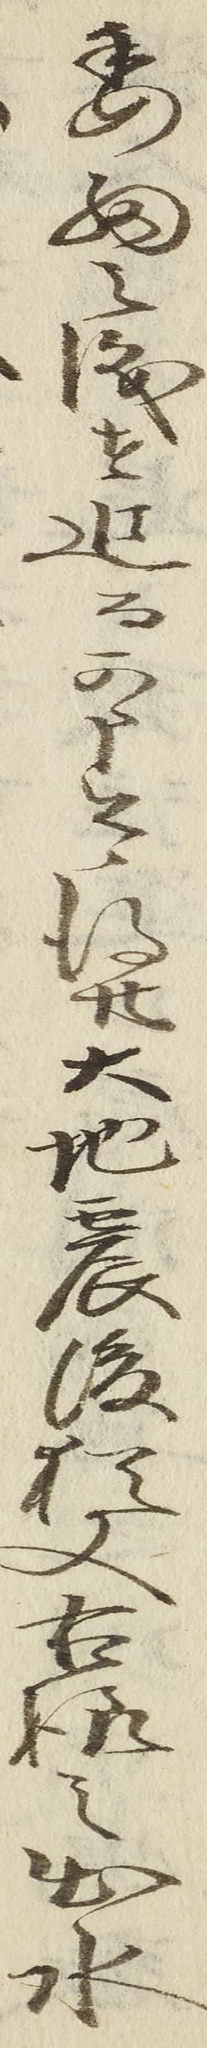委細之儀は追而可申上候得共大地震後猶又右様之出水
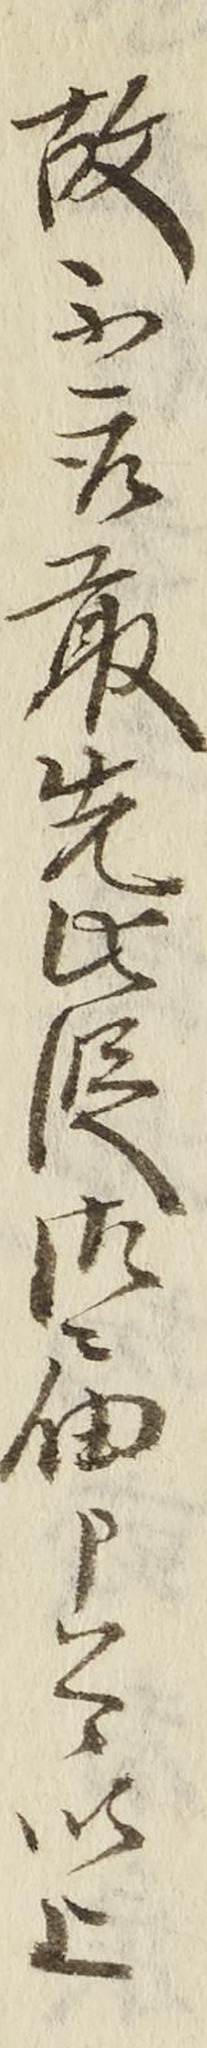故不取敢先此段御届申上候以上
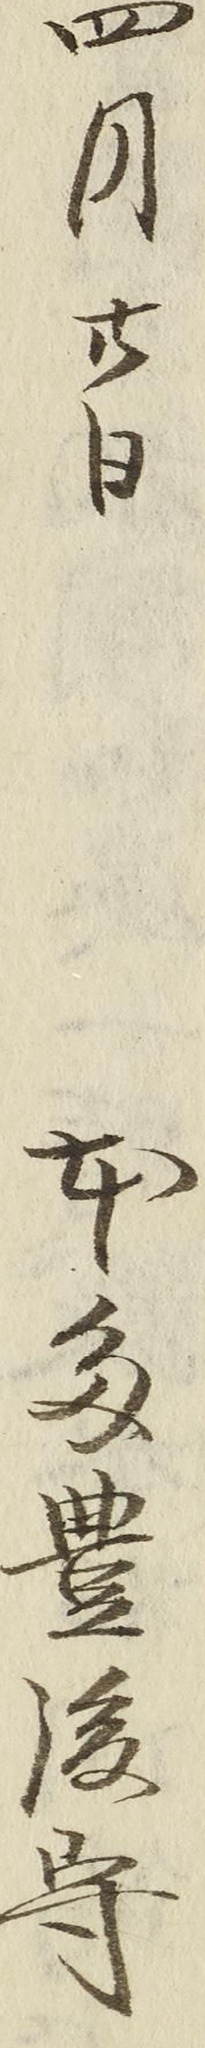四月廿日本多豊後守
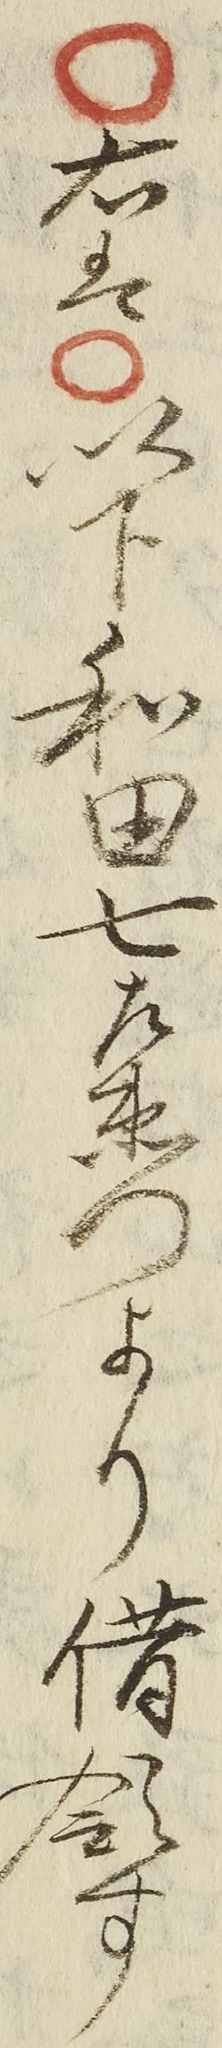○右は○以下和田七左衛門より借領

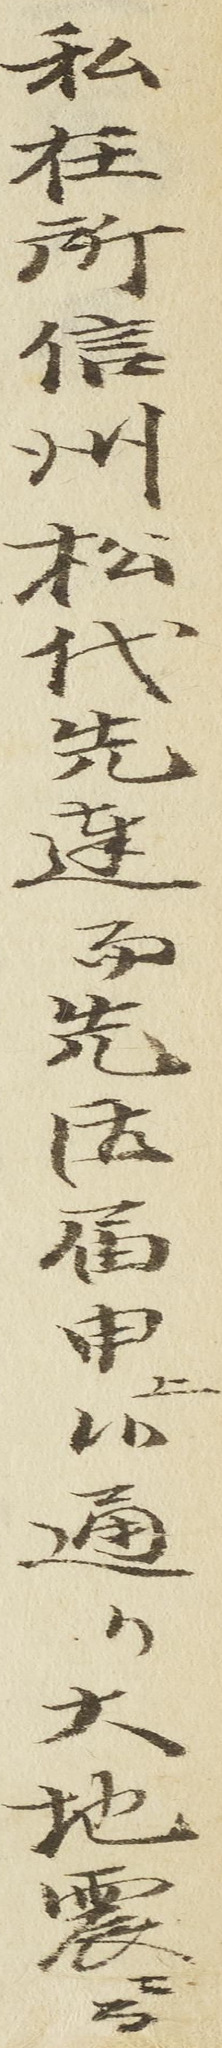私在所信州松代先達而先御届申上候通り大地震
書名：信濃國大地震記　乾
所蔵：東京大学地震研究所図書室 Earthquake Research Institute Library, The University of Tokyo, JAPAN
